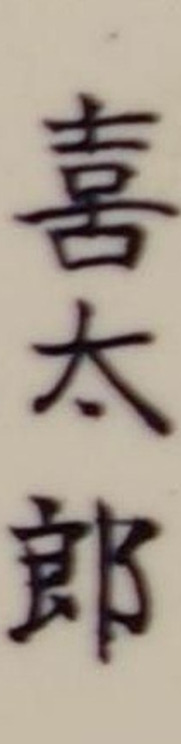喜太郎
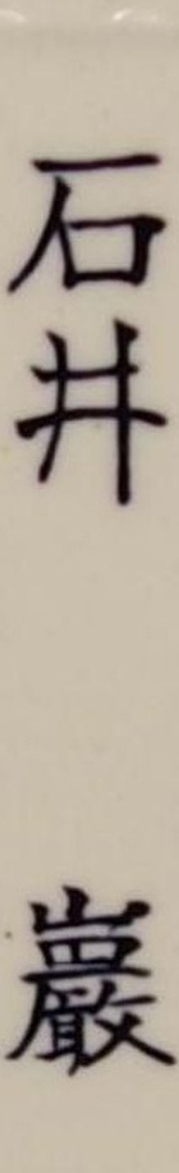石井巌
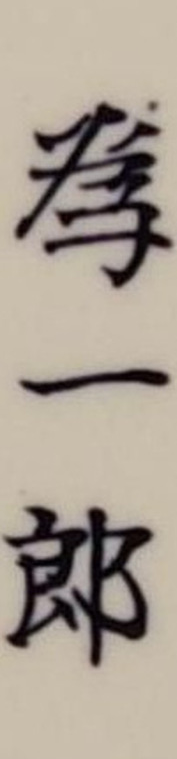為一郎
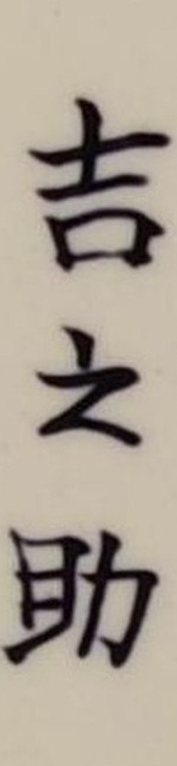吉之助
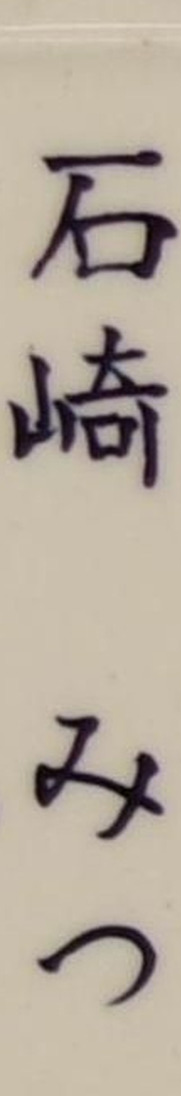石崎みつ

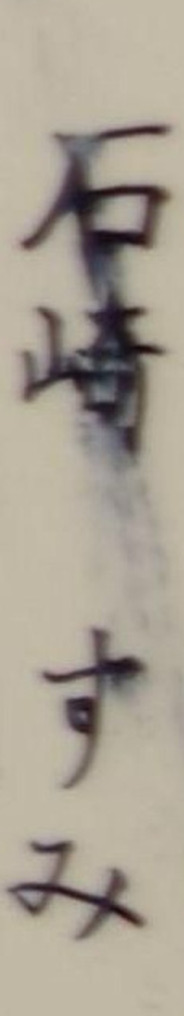石崎すみ
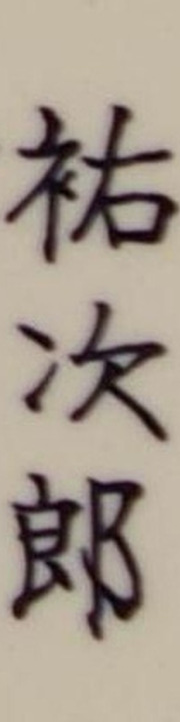祐次郎
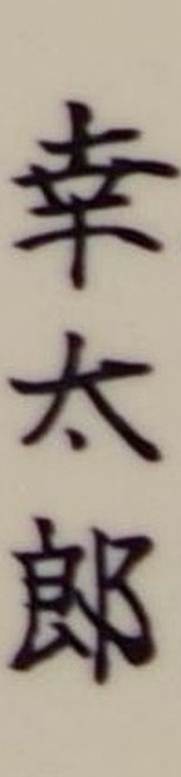幸太郎
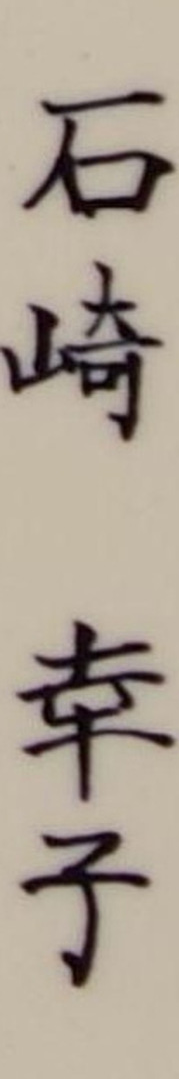石崎幸子
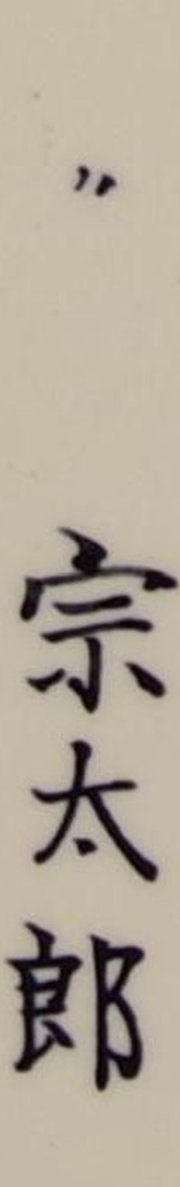宗太郎
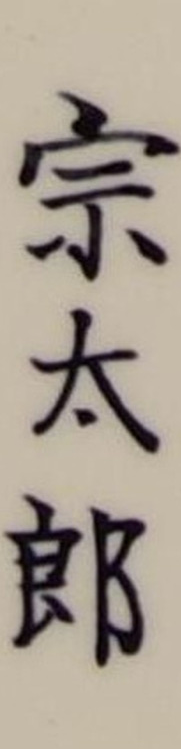宗太郎
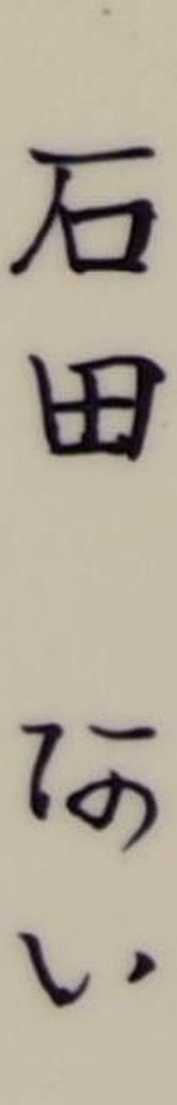石田あい
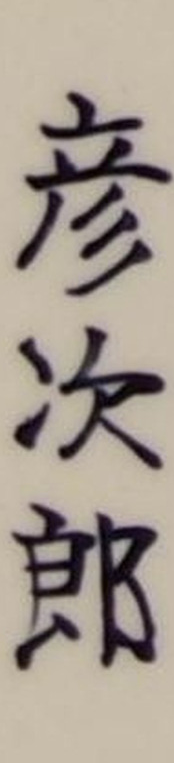彦次郎

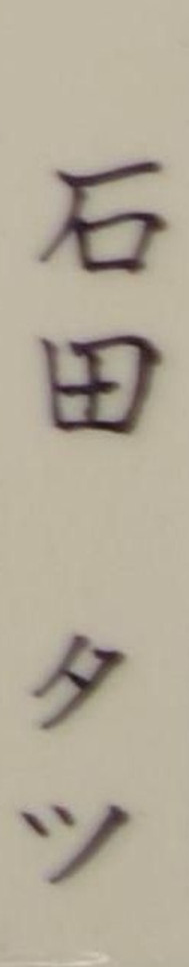石田タツ
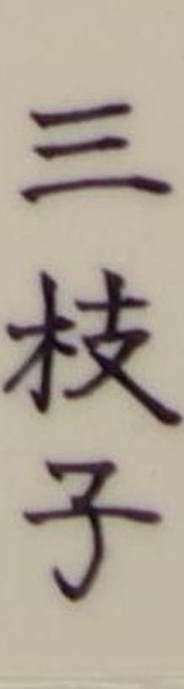三枝子
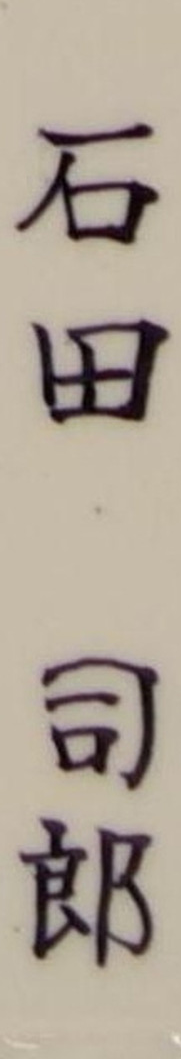石田司朗
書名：M~S
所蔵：高野山金剛峯寺
